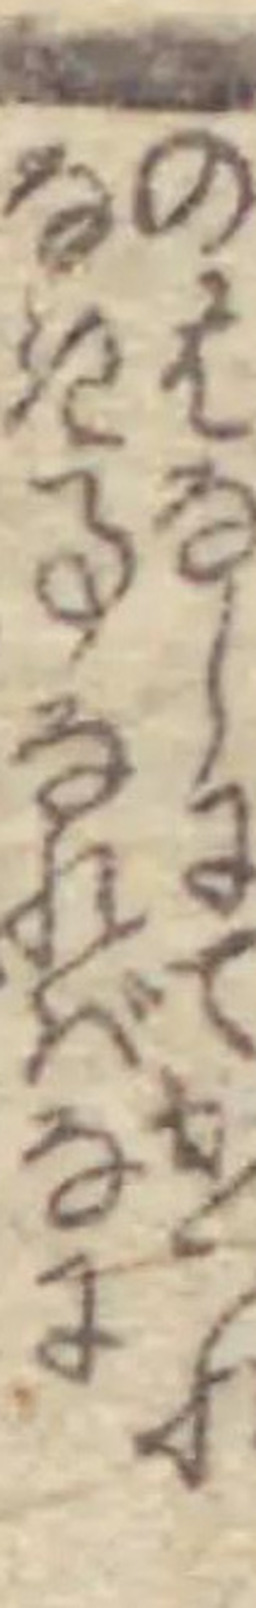なき事なればなに
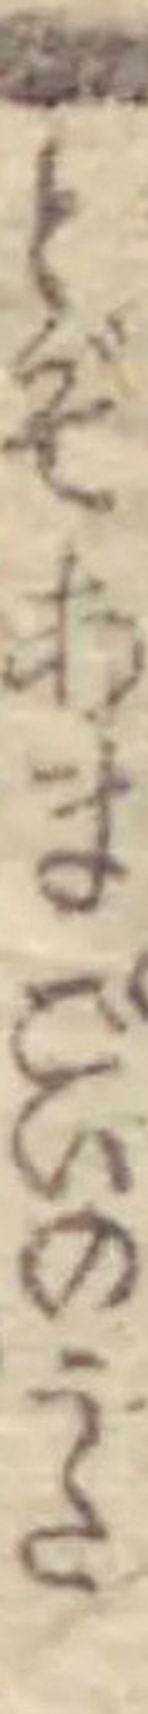とぞあまごいのうた
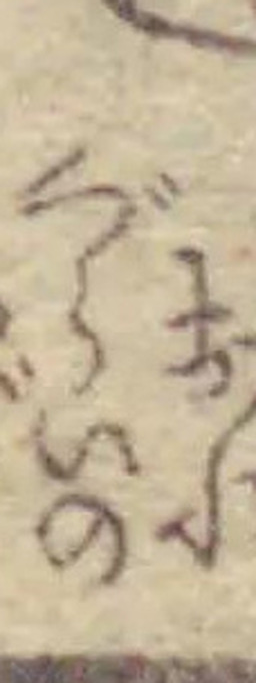ぐらいの
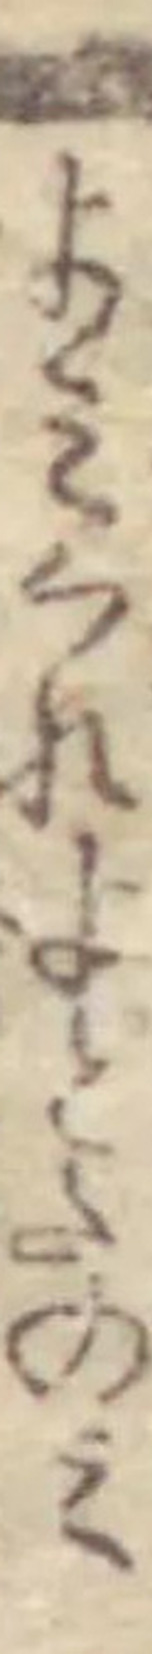よみくれよとたのみ
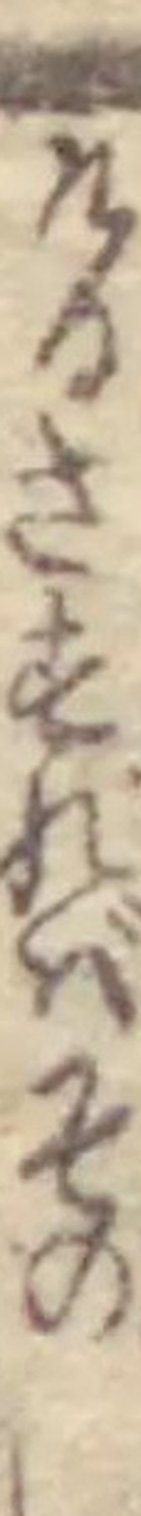けるさすればその
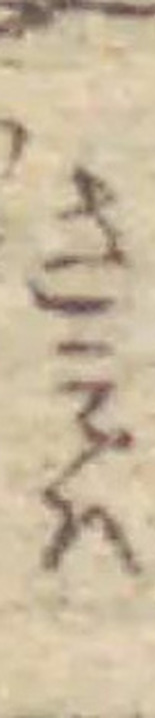さみは
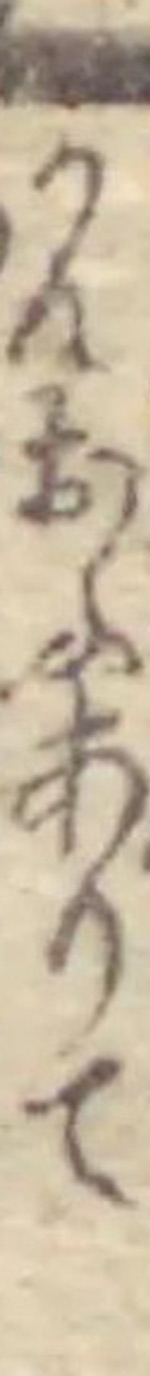かんおふありて
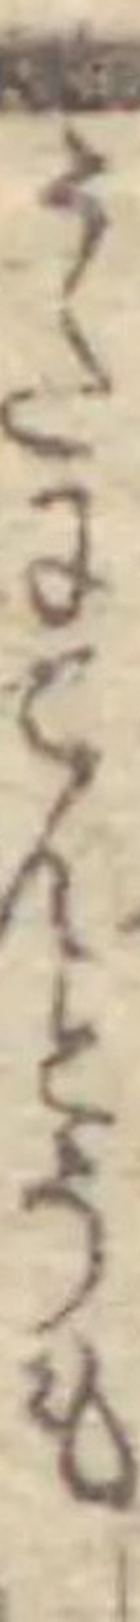うたにてんとうも
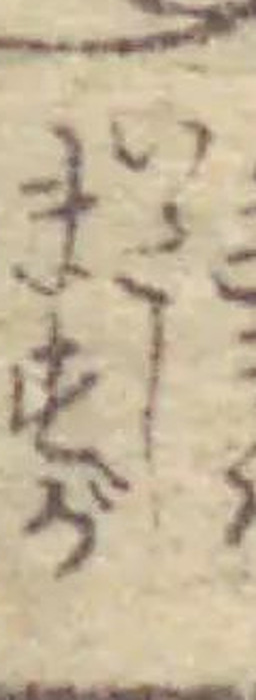ますが
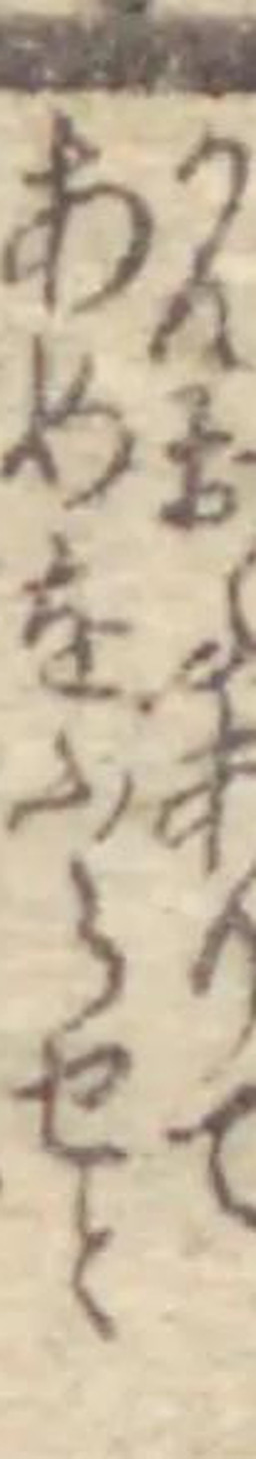あめをふらせと
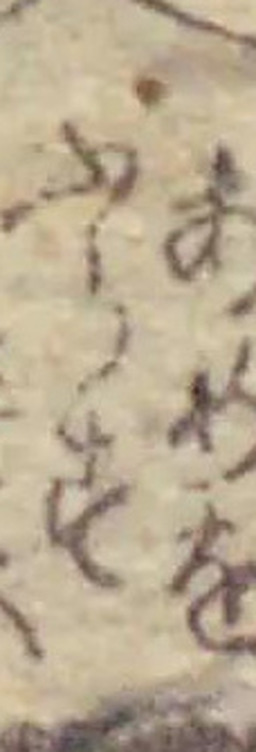ふらす
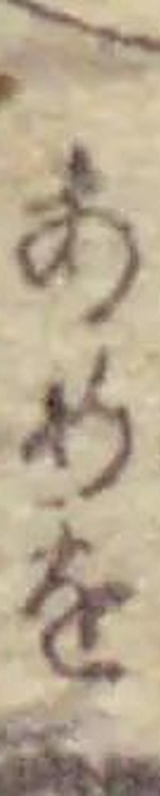あめを
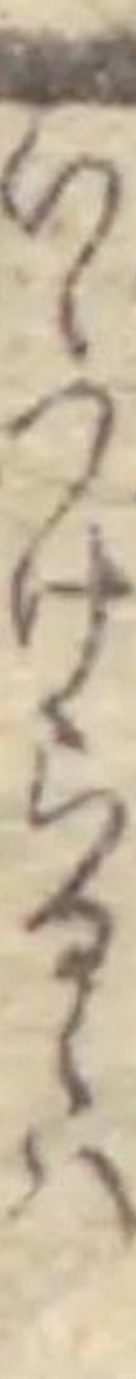いゝつけらるゝは
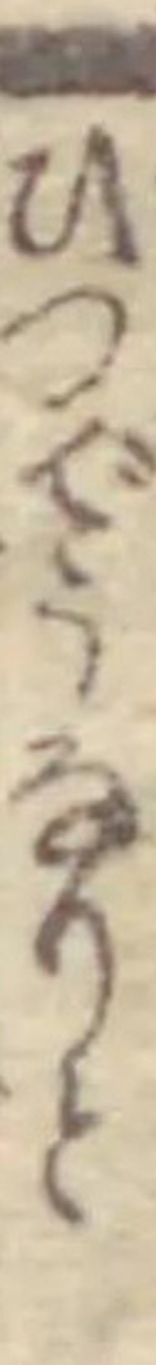ひつでうなりと
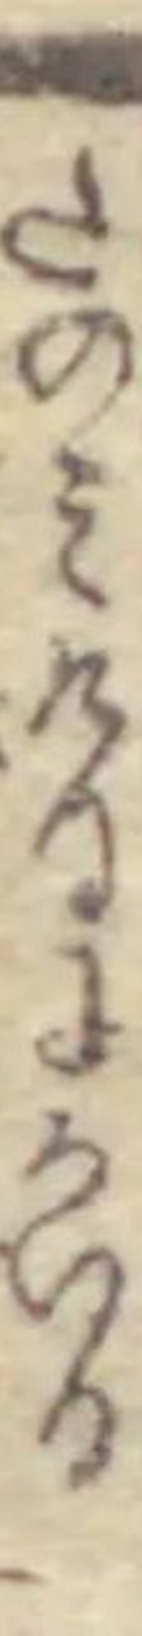たのみけるにかいる
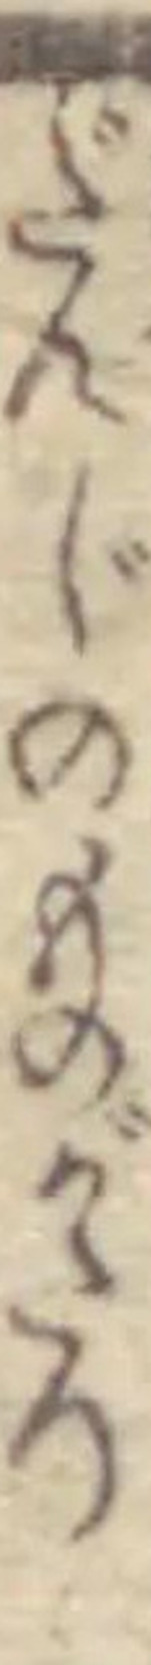だんじのものがたり
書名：雨宮風宮出儘略縁記 3巻
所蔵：国立国会図書館 National Diet Library, JAPAN
